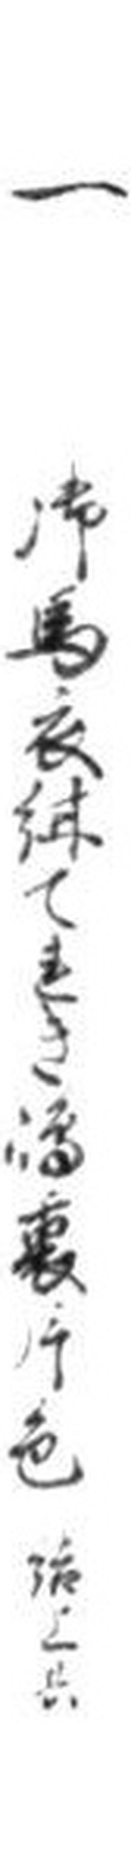一御馬衣紺てれき嶋裏片色結上共
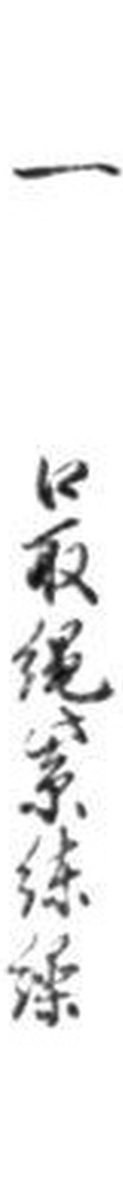一口取縄紫練繰
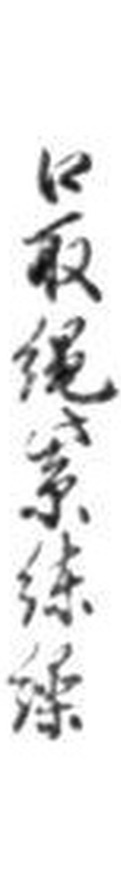一口取縄紫練繰
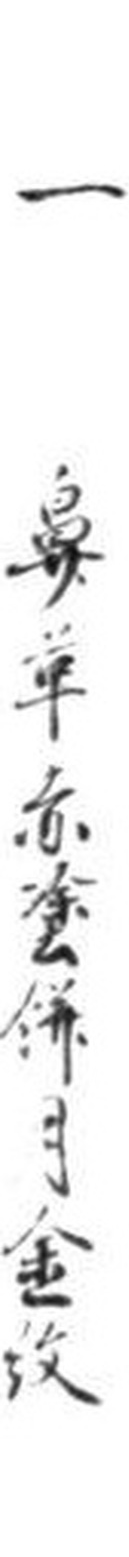一鼻革赤塗餅月金紋
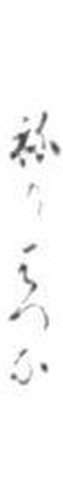ねり之つな
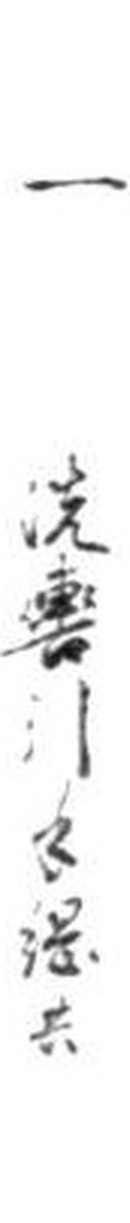一洗轡引手綱共
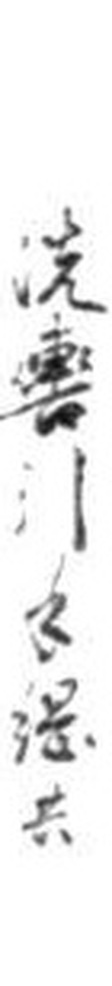一洗轡引手綱共
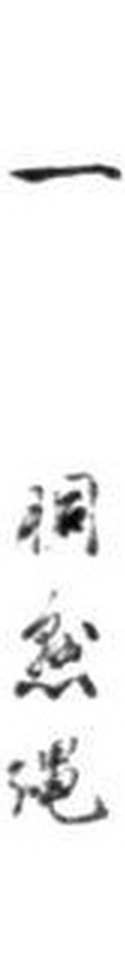一胴懸縄
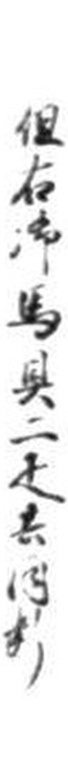但右御馬具二疋共同断
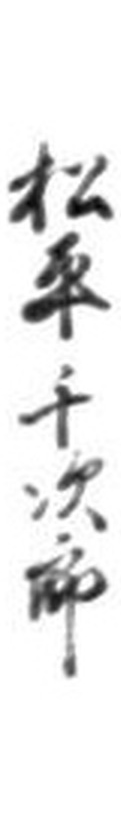松平千次郎
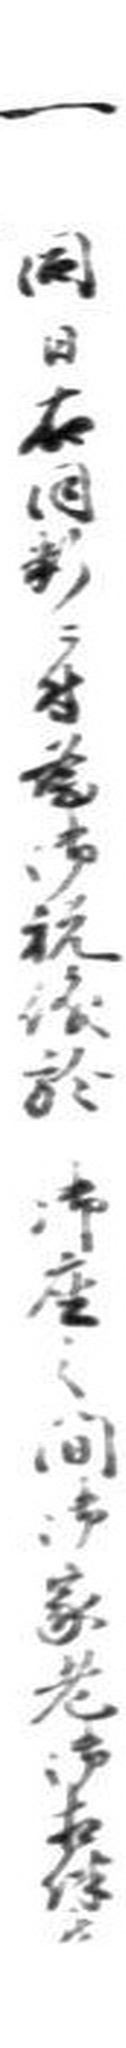一同日右同断ニ付為御祝儀於御座之間御家老御相伴被
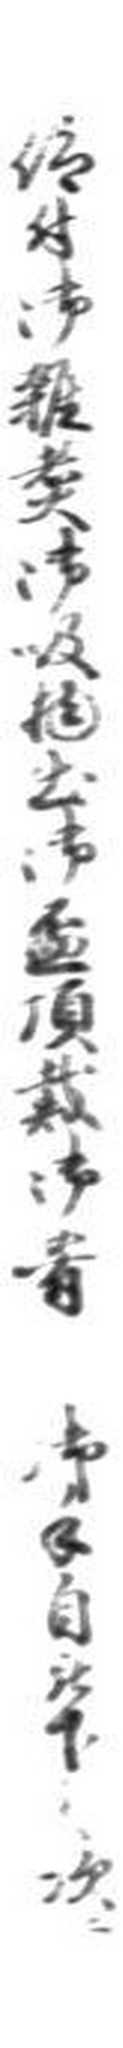仰付御雑煮御吸物出御盃頂戴御肴御手自被下之次ニ
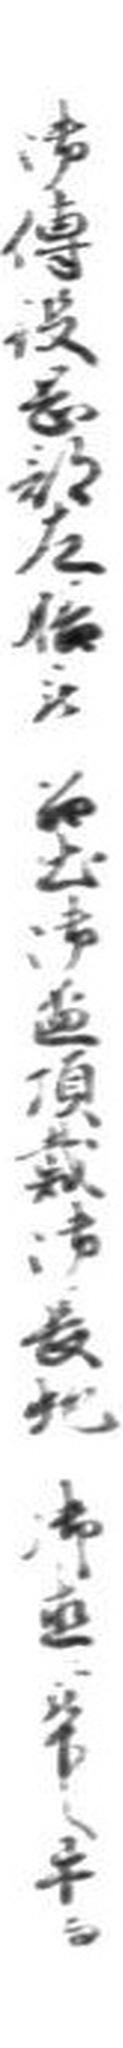御傅役岡部左膳被召出御盃頂戴御長蚫御直ニ被下之畢而
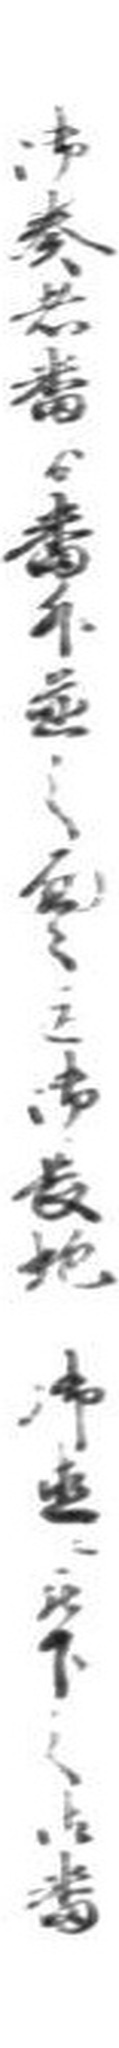御奏者番ゟ番外並之面々迄御長蚫御直ニ被下之御番
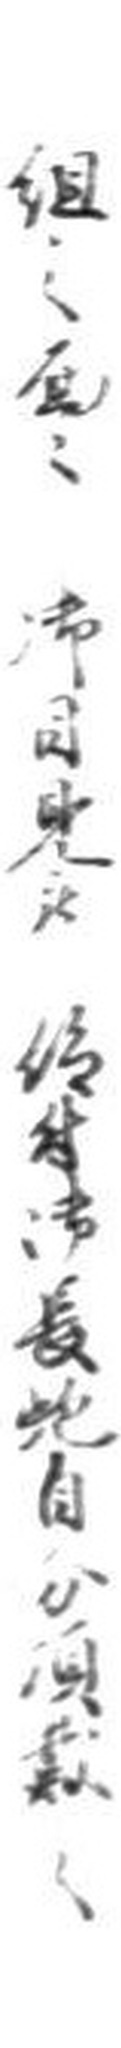組之面々御目見披仰付御長蚫自分頂戴之
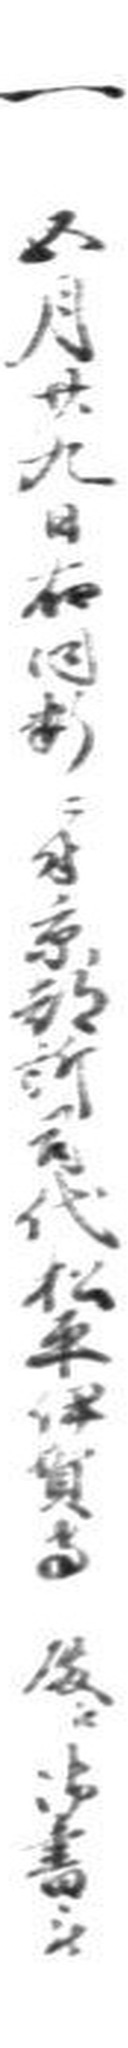一五月廿九日右同断ニ付京都所司代松平伊賀守殿江御書被
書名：家譜 三十八 宗矩公 従享保九年五月到享保九年十二月
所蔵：福井県文書館 Fukui Prefectural Archives
